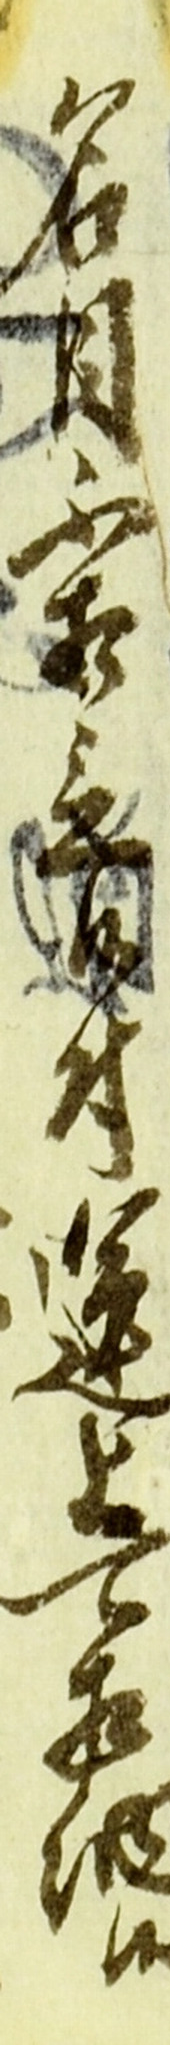名目不相立候付運上可相納候
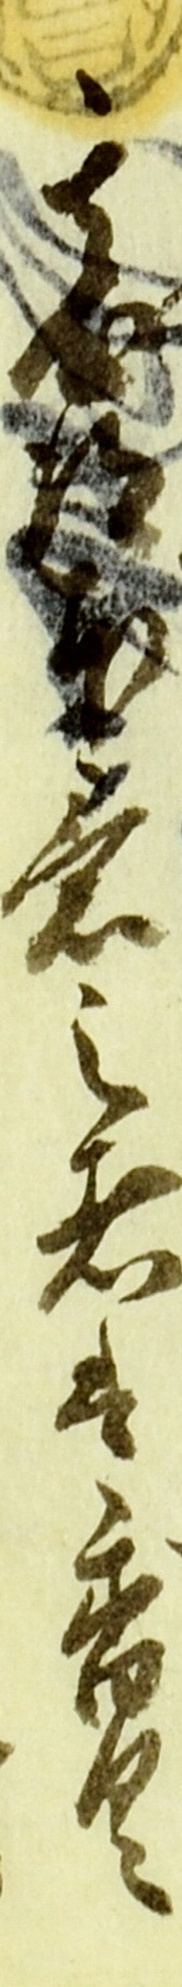其心得本意之者は香具
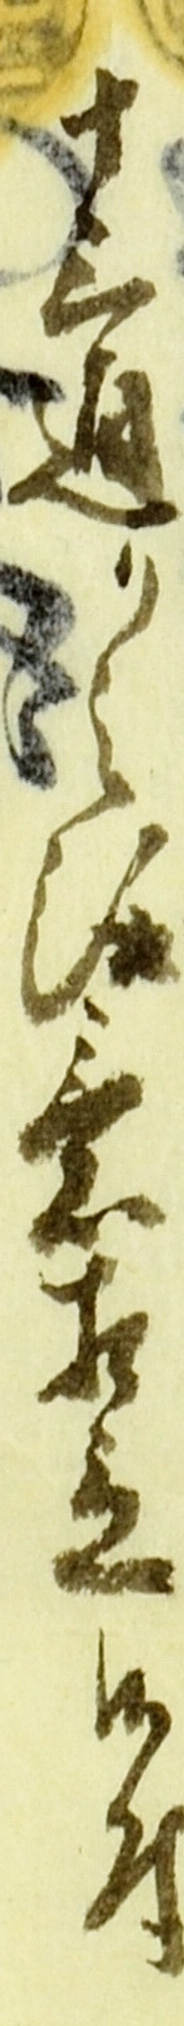十三通り之趣意相立候付
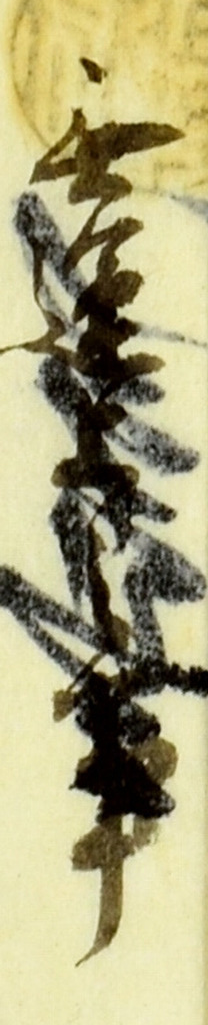無運上之事
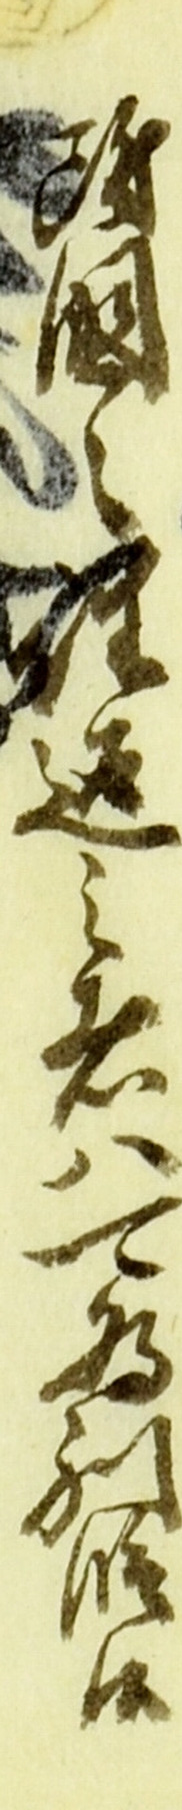附国々往返之者ハ可為別段候
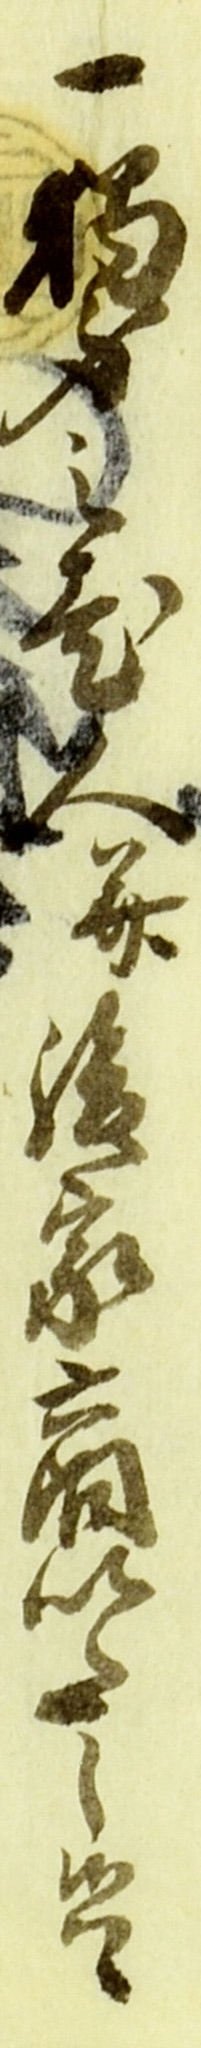一独身之老人幷後家商いたし候ハゝ
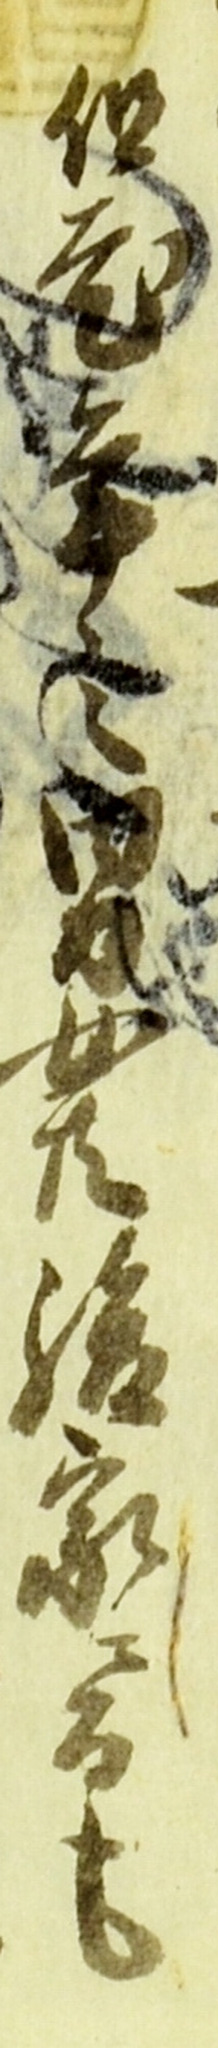但老年之男女共後家ニ而も
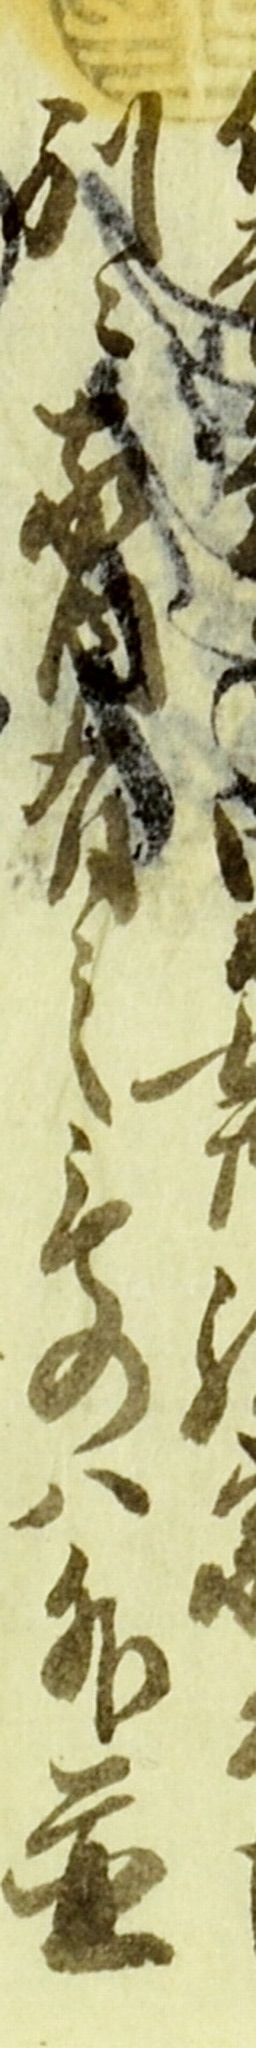別ニ家内有之ものハ外並
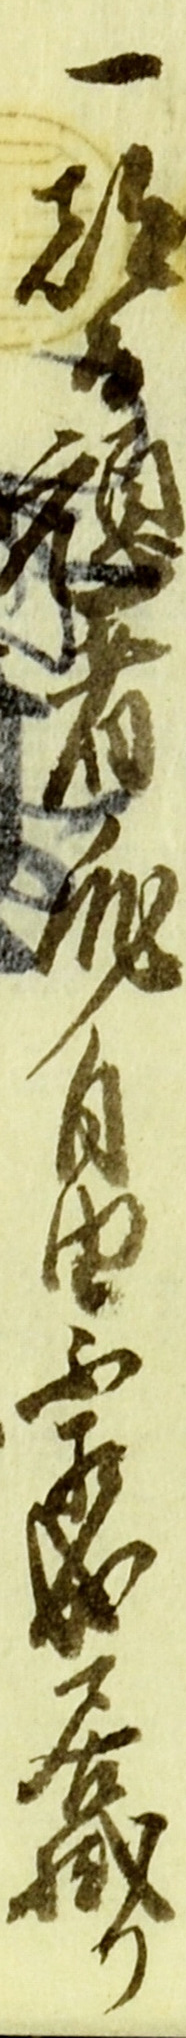一都而頑者身自由不相成居掛り
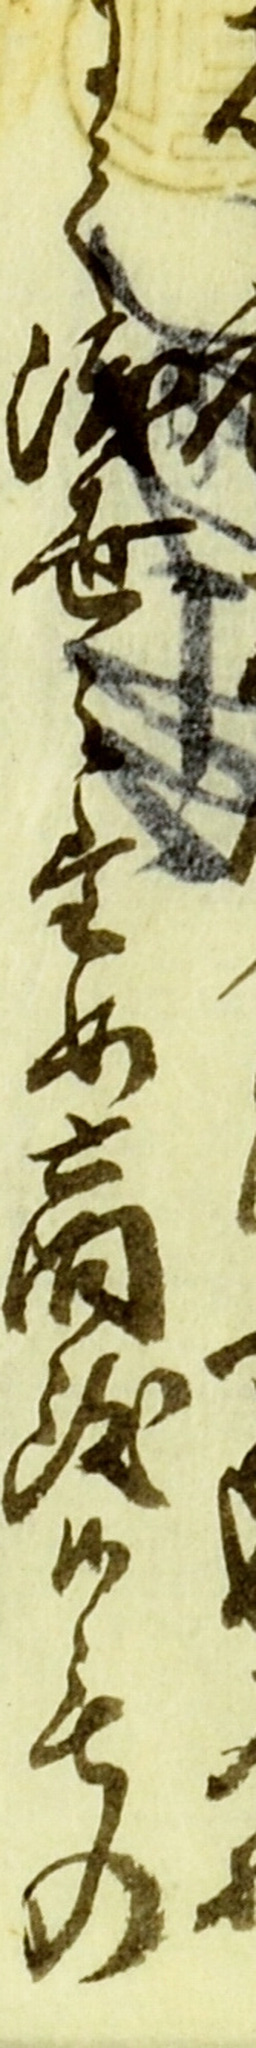にて渡世之ため商致候もの
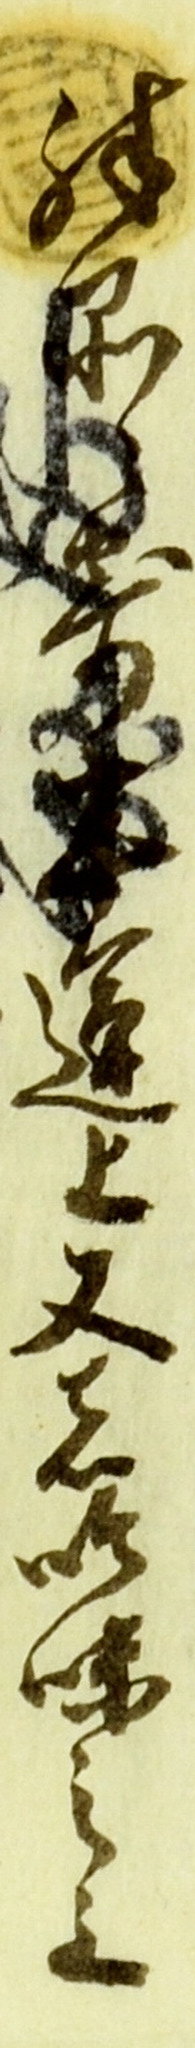殊品ニ寄半運上又者吟味之上
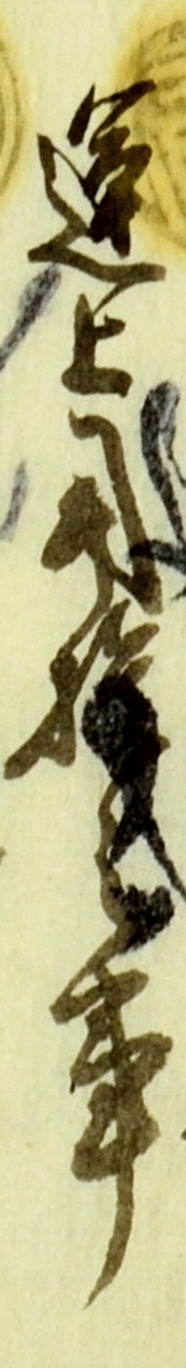運上用捨之事
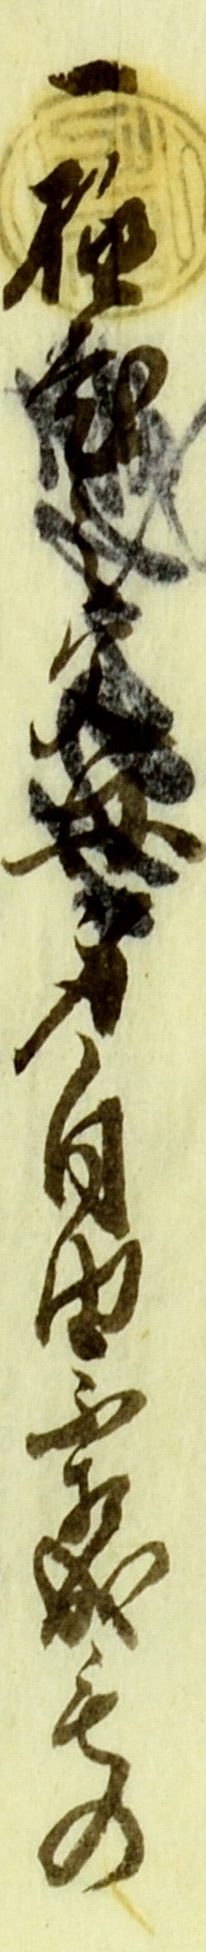一極老之父母身自由不相成もの
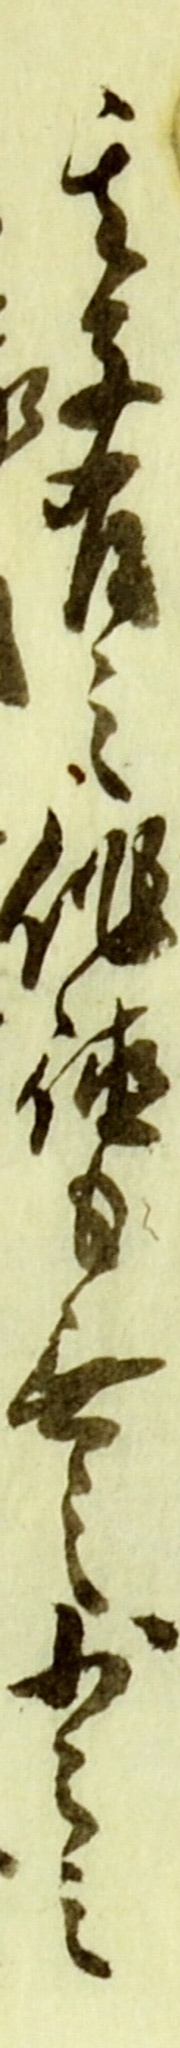其子有之作徳も無之少々之
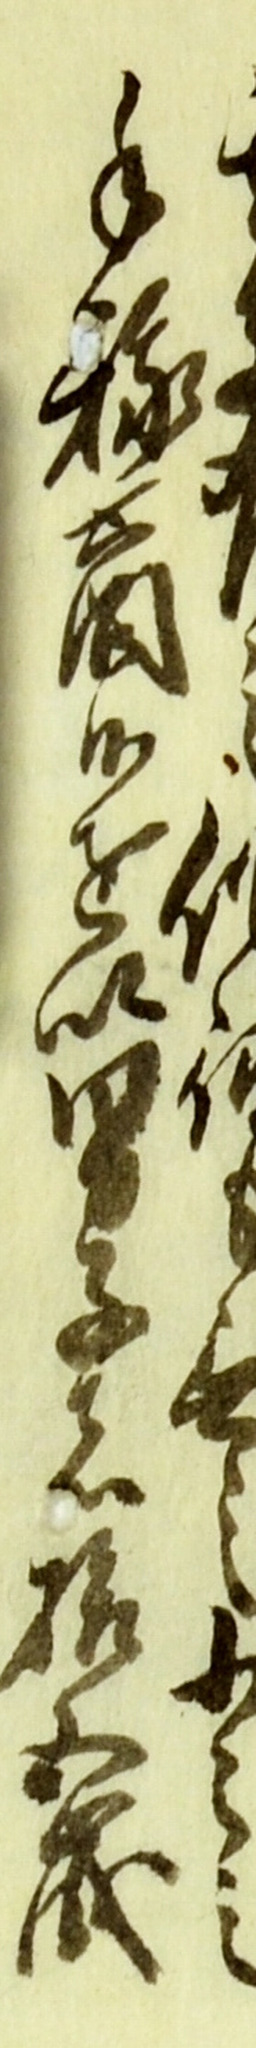手稼商候を以男子者拾五歳

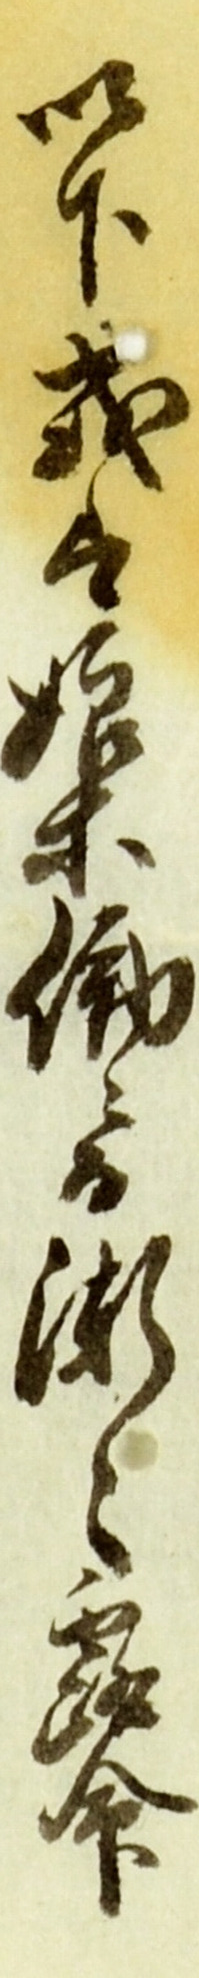以下或は娘等働ニ而漸々露命
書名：分一方諸運上御定法
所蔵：伊那市立高遠町図書館・合同会社AMANE
